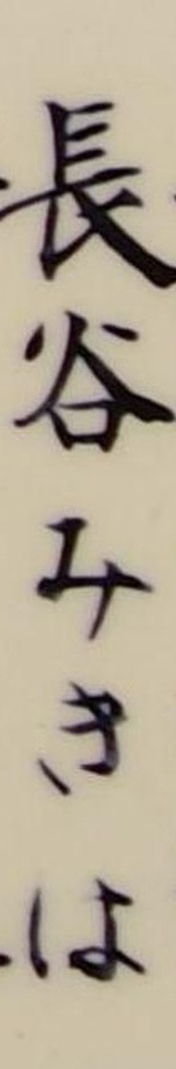長谷みきは
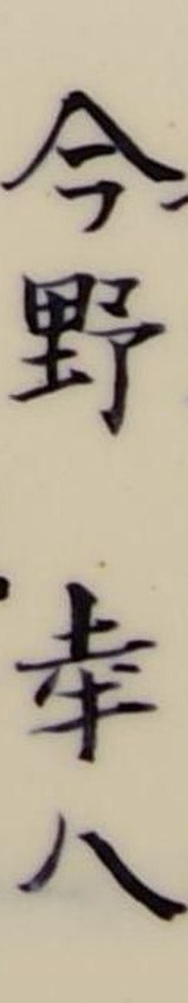今野幸八
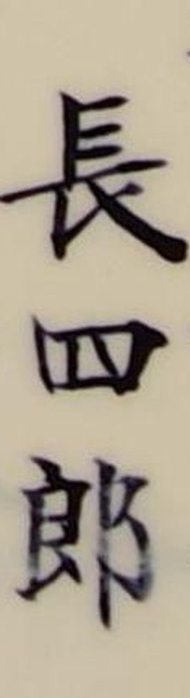長四朗
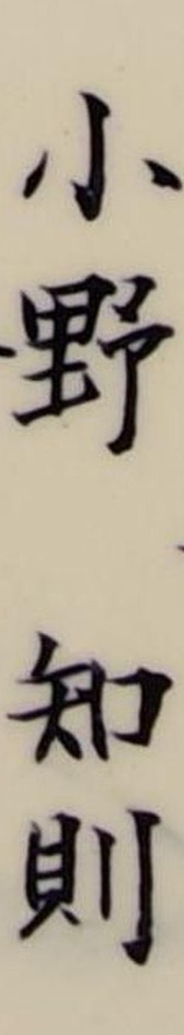小野知則
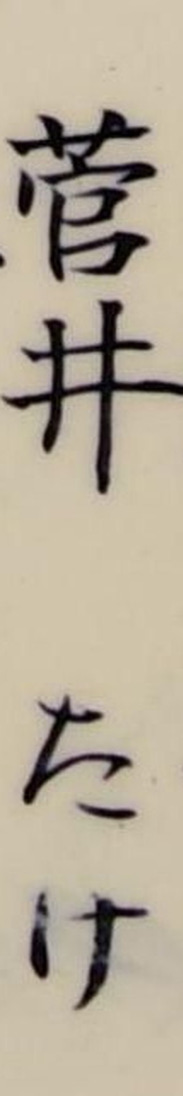菅井たけ
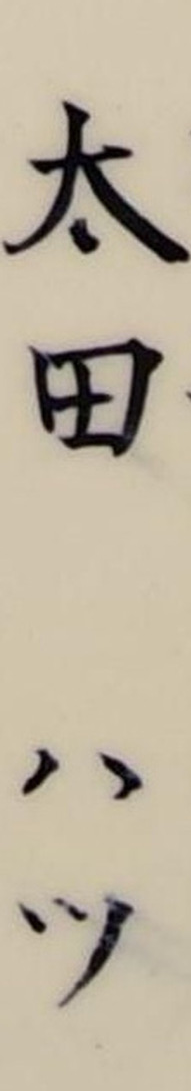太田ハツ
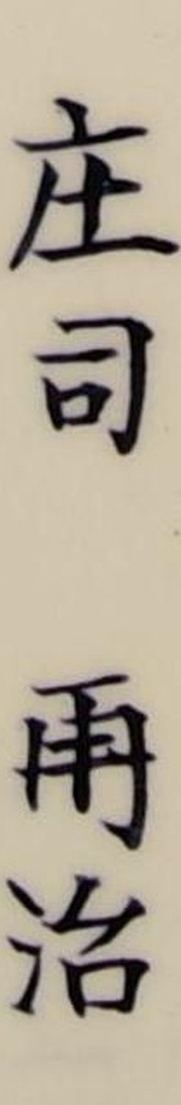庄司再治
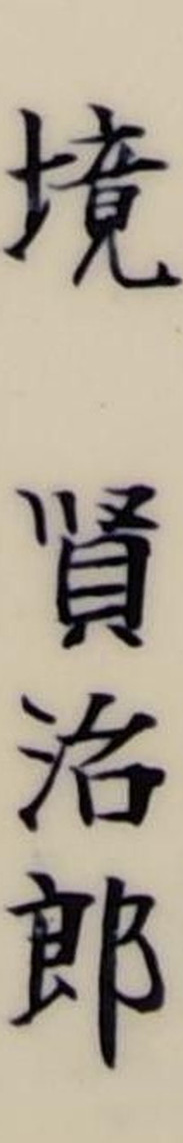境賢治郎
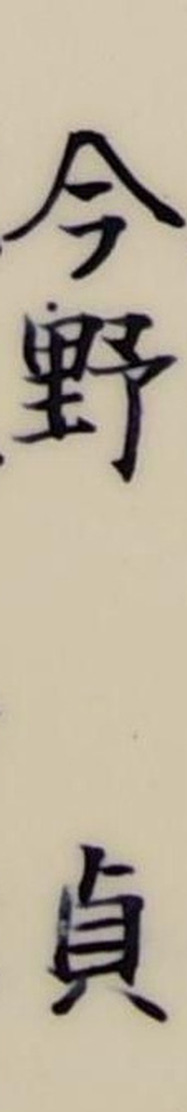今野貞
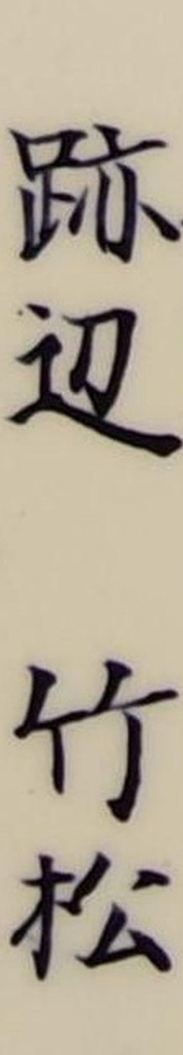跡辺竹松
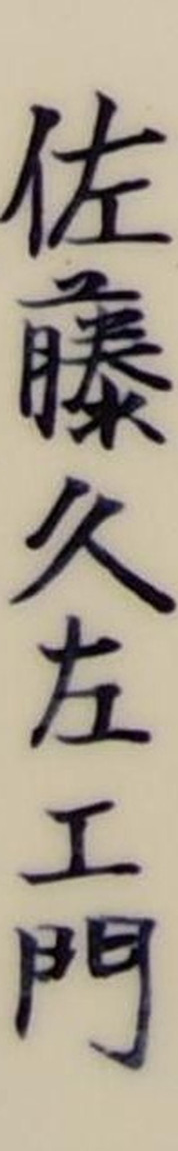佐藤久左エ門
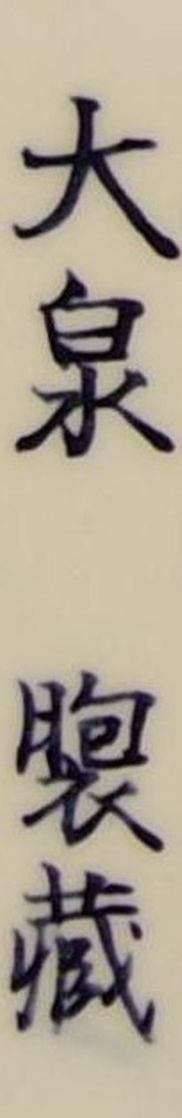大泉製蔵
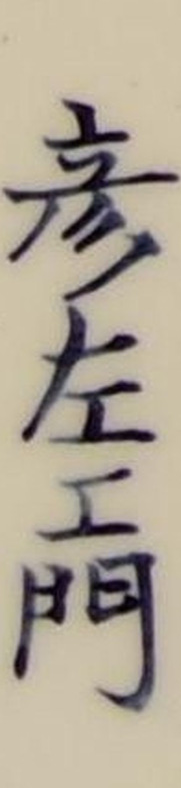彦左エ門
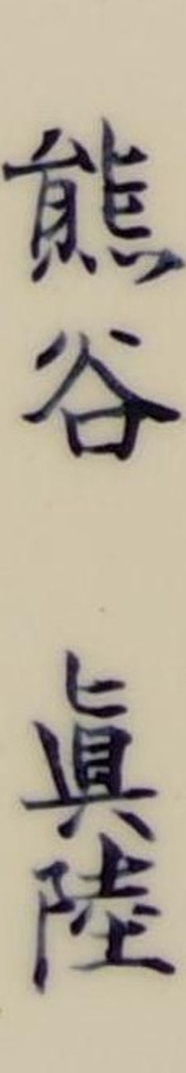熊谷真陸
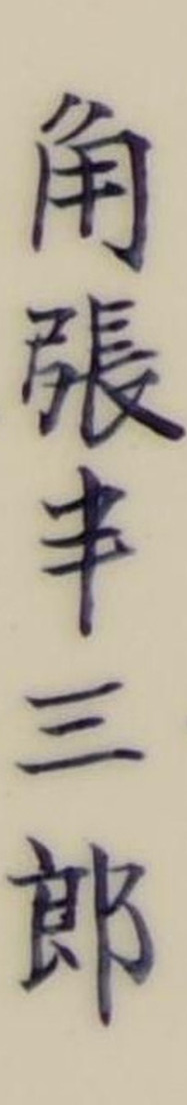角張半三郎
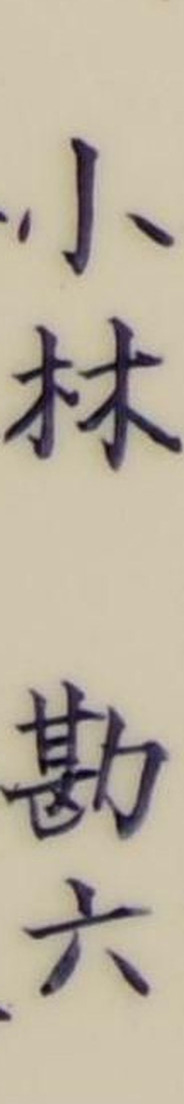小林勘六
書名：A~D
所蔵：koyasan kongobuji
